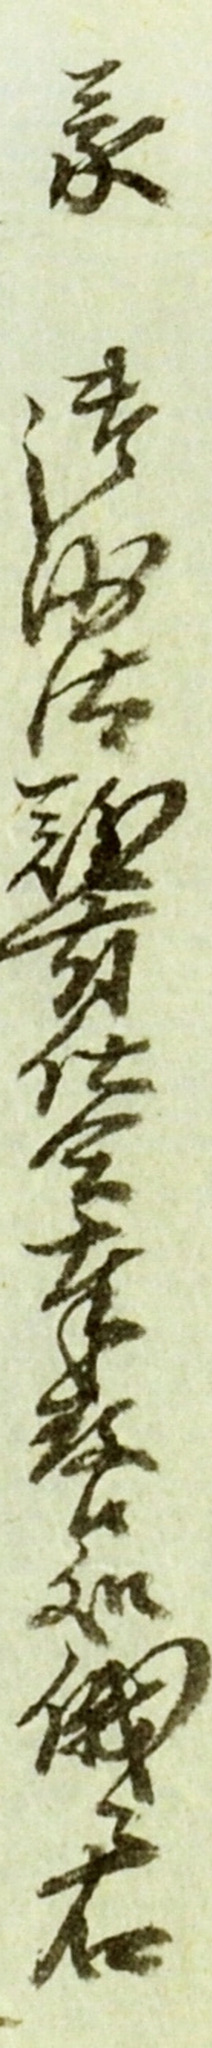蒙御沙汰難有仕合奉存候処俄ニ右
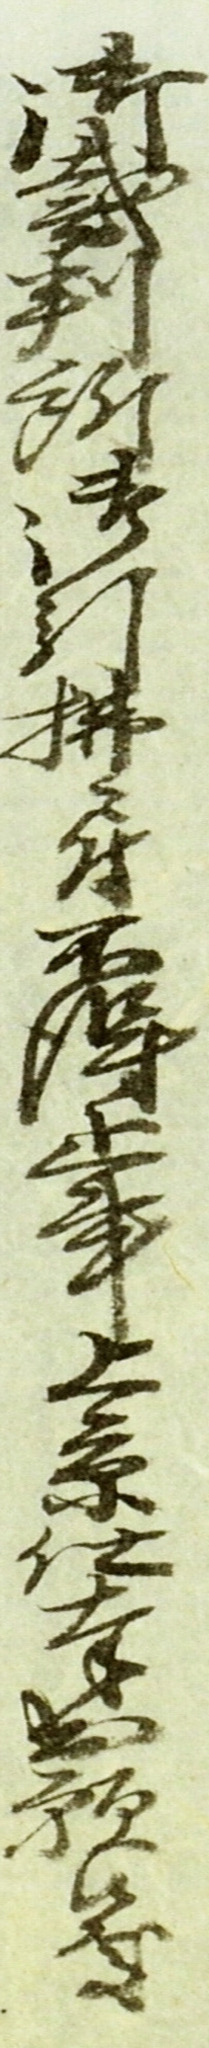御裁判所御引払ニ付不得止事上京仕奉出願候処
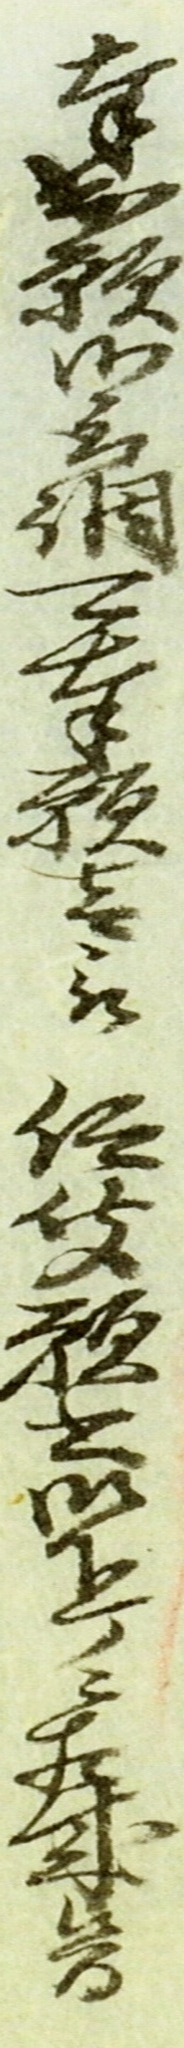奉出願御取調可奉願旨被仰聞願書御下ケニ相成候間
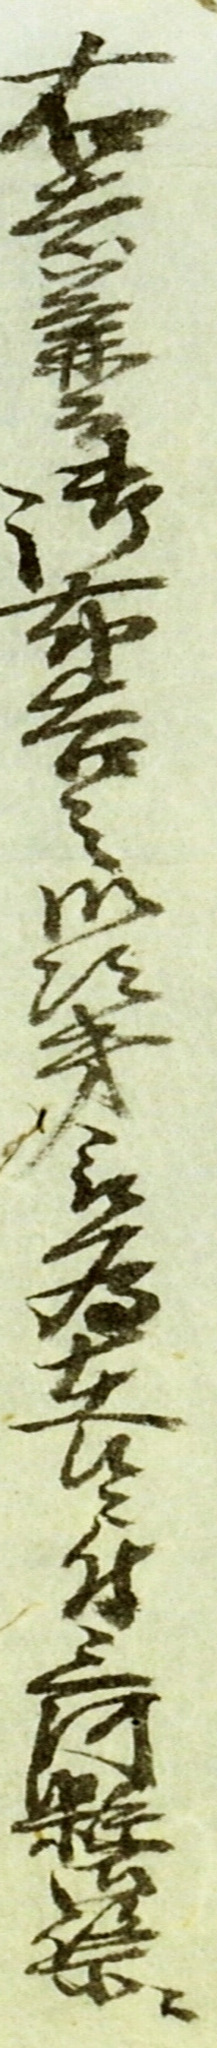右者兼而御布告之御次第被為在候ニ付三河県御役所ニ
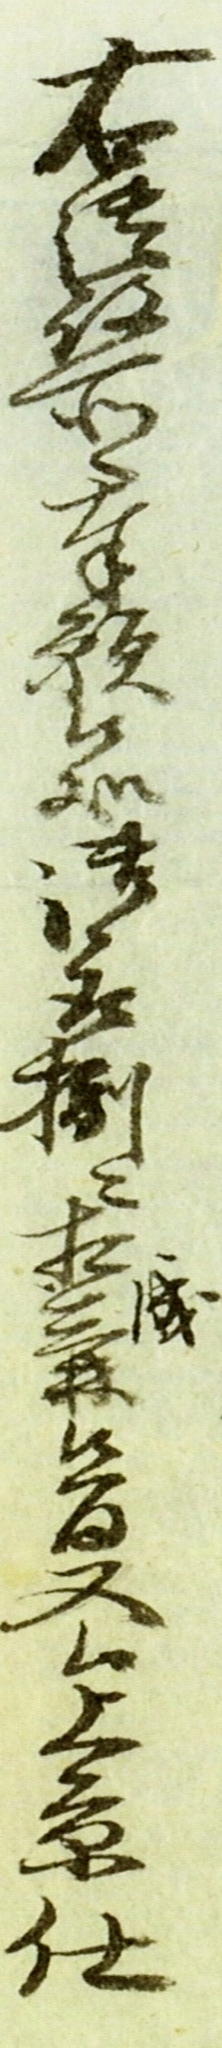右御役所へ奉願候処御取捌ニ相成候間又候上京仕
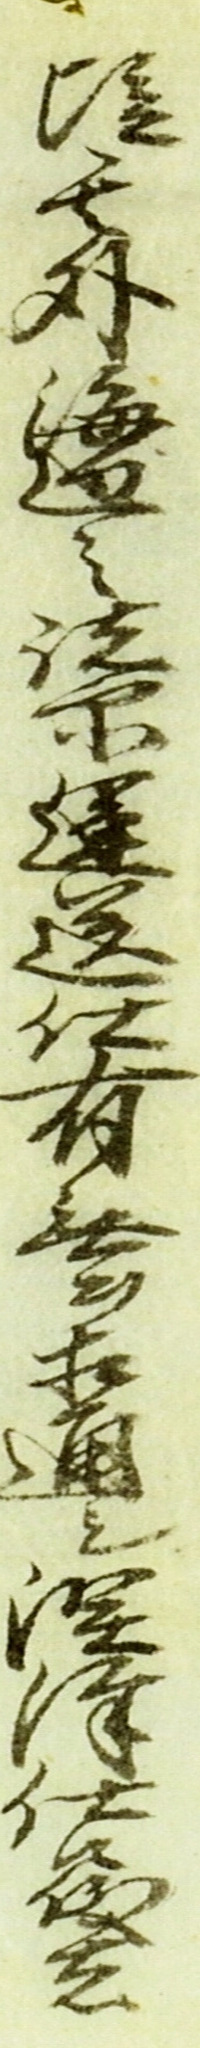塩其外海辺之諸品運送仕有無ヲ相通シ潤沢仕候儀者
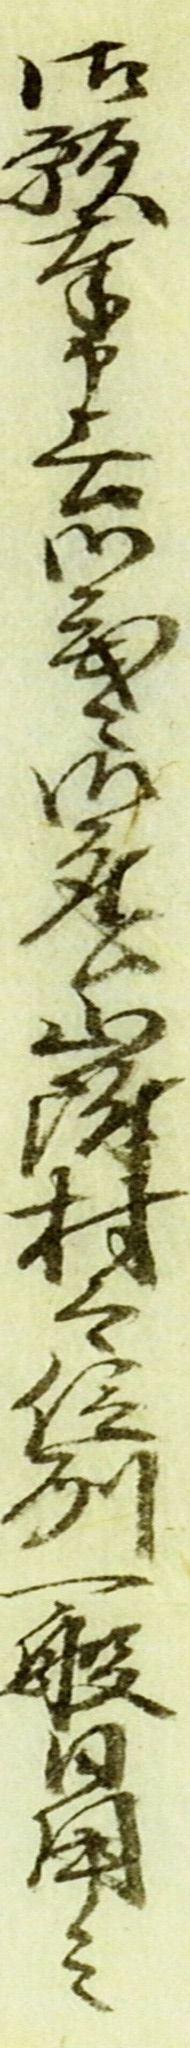御願奉申上候御義ニ御座候山附村々信州一般日用之
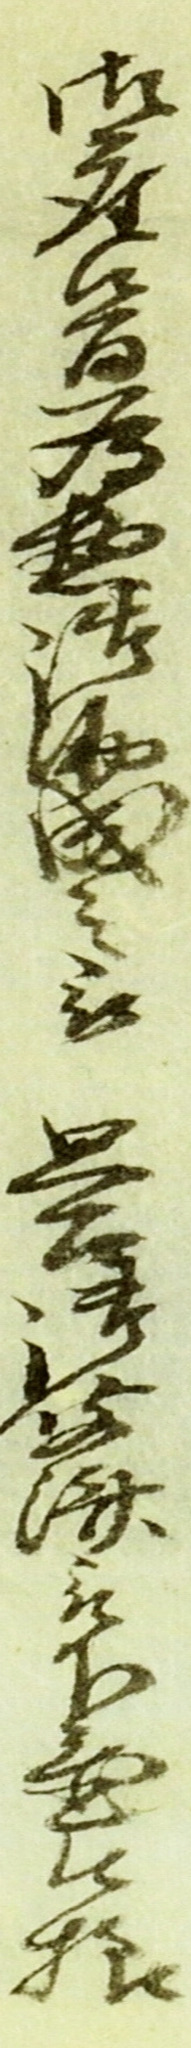御座候間為惣御助成之被思召御聞済被下置候様
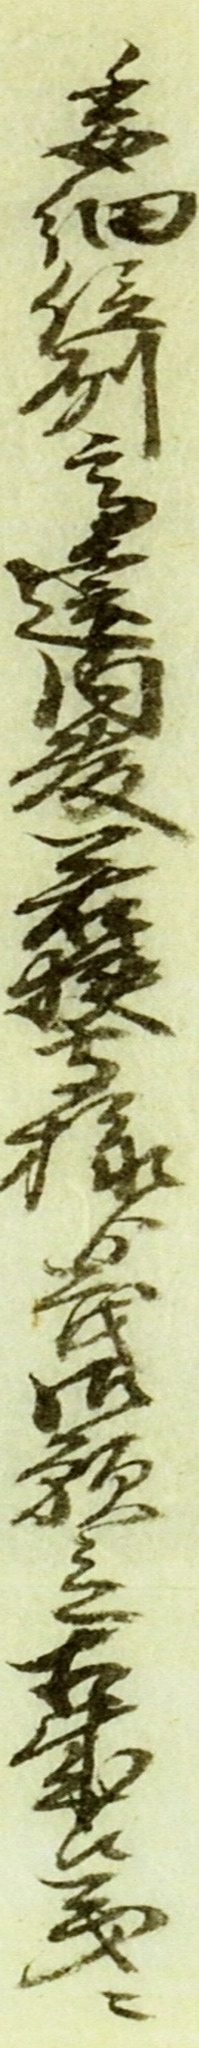委細信州高遠内藤若狭守様ゟ茂御願立相成候義ニ
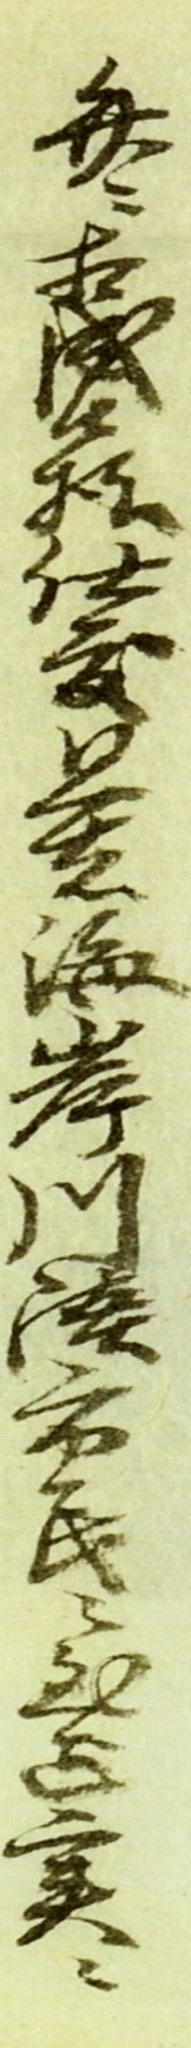弁ニ相成候様仕度且者海岸川陸市民ニ至迄実ニ
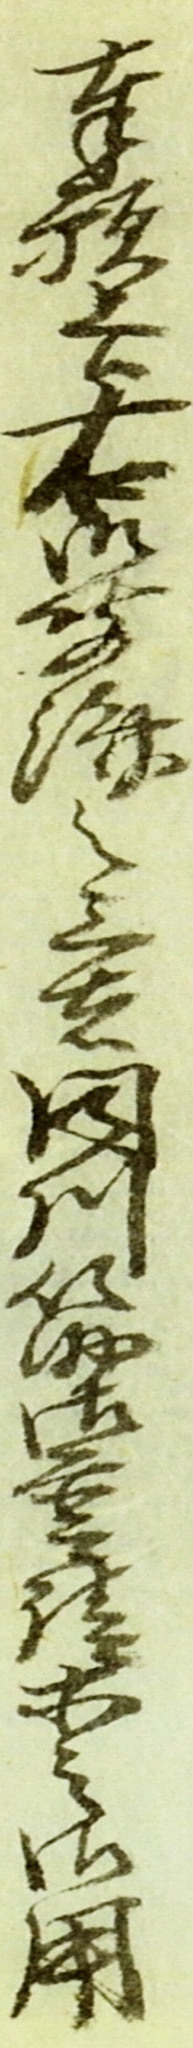奉願上候右御聞済之上者同川筋御普請等之御用
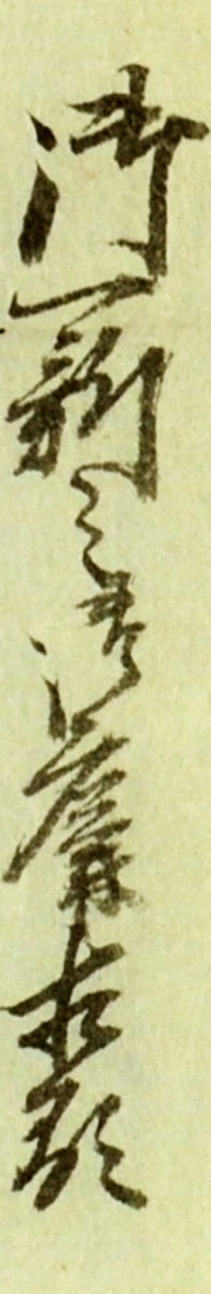御一新之御廉相顕
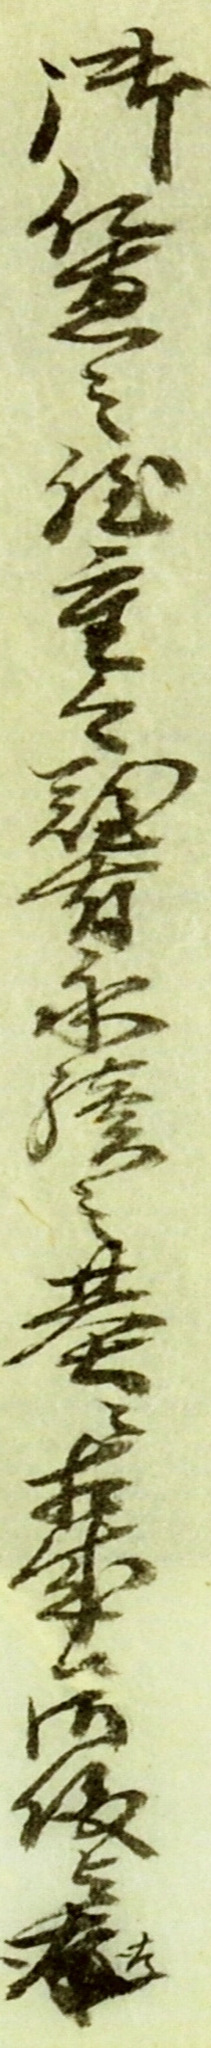御仁恵之程重々難有永続之基ニ相成候御儀与存
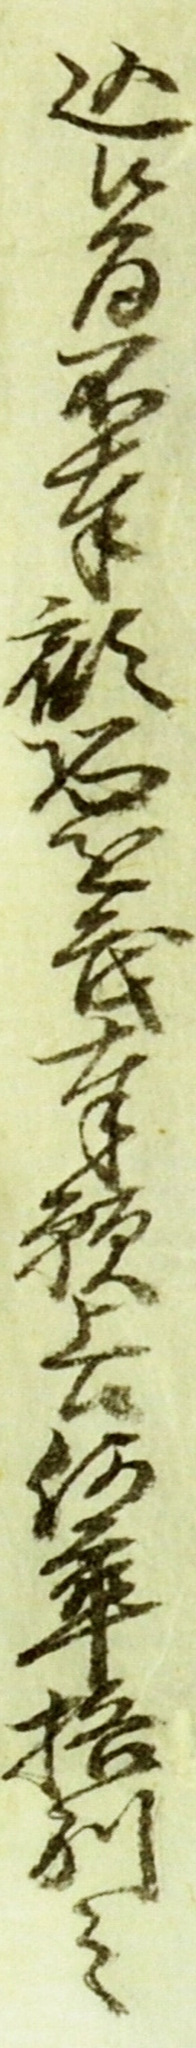込候間不奉顧恐を茂奉願上候何卒格別之

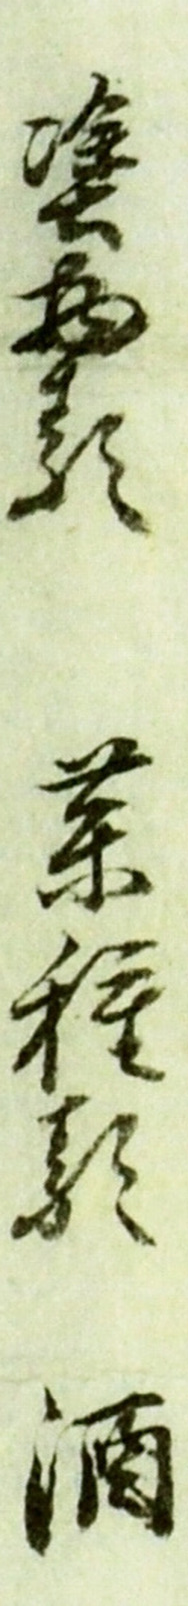塗物類菜種類酒
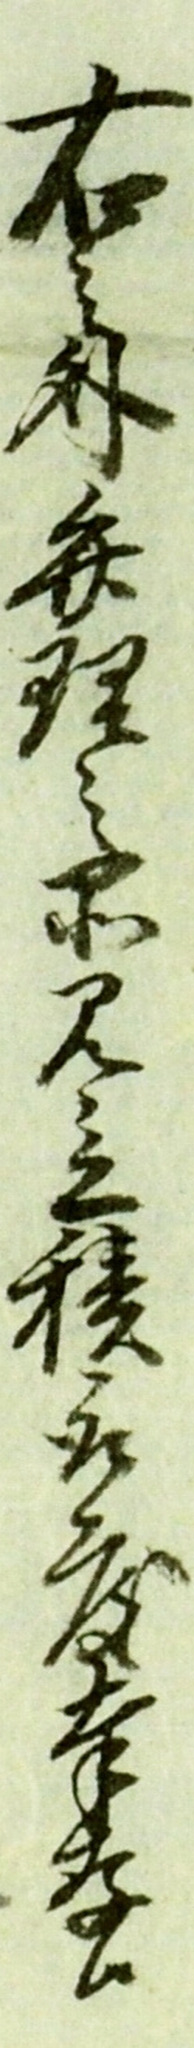右之外弁理之品見立積取度奉存候
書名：乍恐以書付奉願上候
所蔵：伊那市立高遠町図書館・合同会社AMANE
